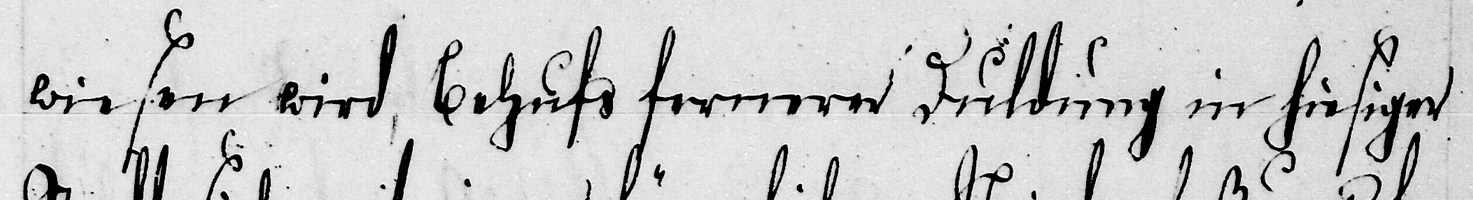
wiesen wird, Behufs fernerer Duldung in hiesiger
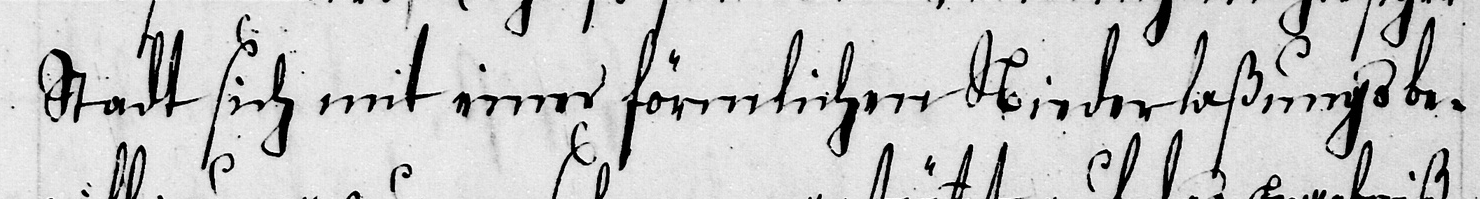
Stadt sich mit einer förmlichen Niederlaßungsbe¬
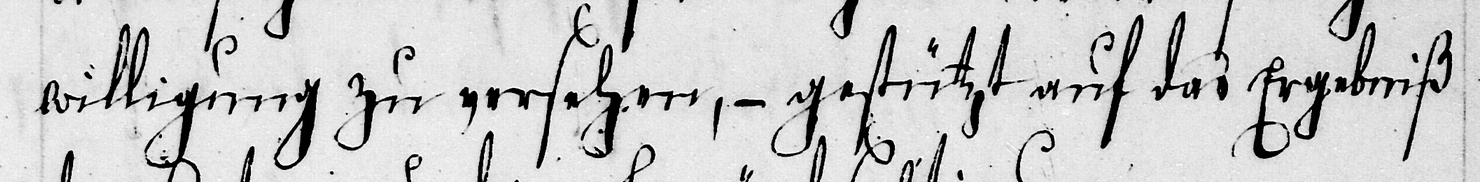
willigung zu versehen, – gestützt auf das Ergebniß
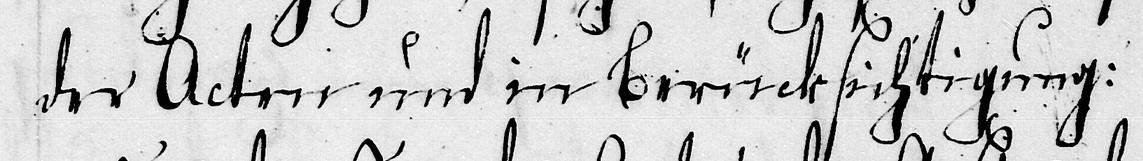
der Acten und in Berücksichtigung:
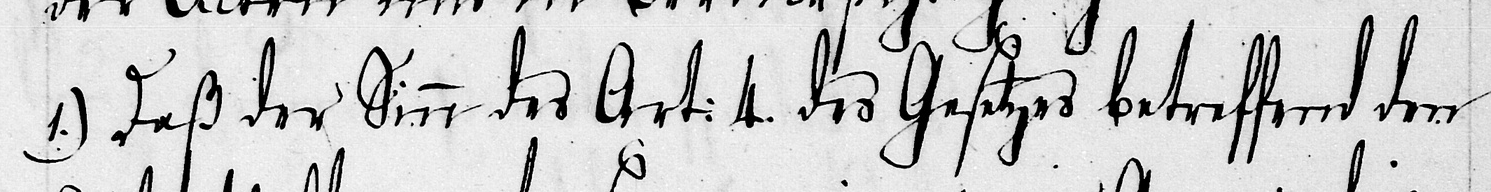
1.) Daß der Sinn des Art: 4. des Gesetzes betreffend den
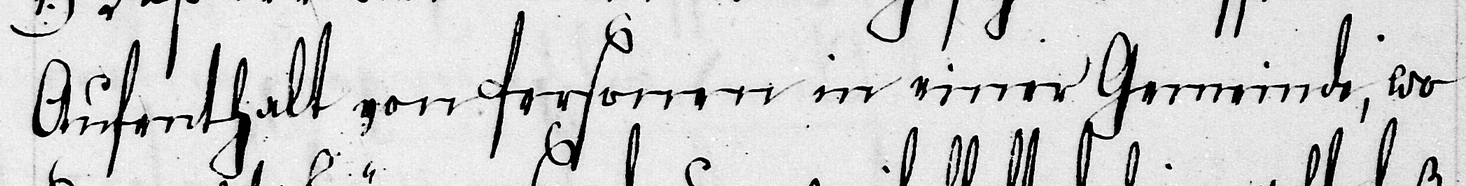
Aufenthalt von Personen in einer Gemeinde, wo
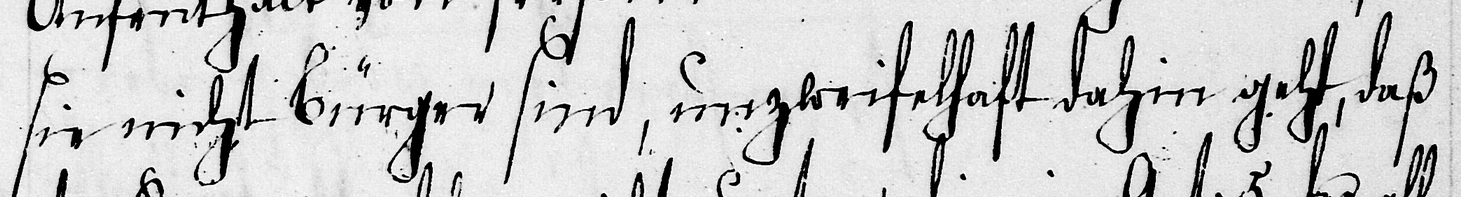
sie nicht Bürger sind, unzweifelhaft dahin geht, daß
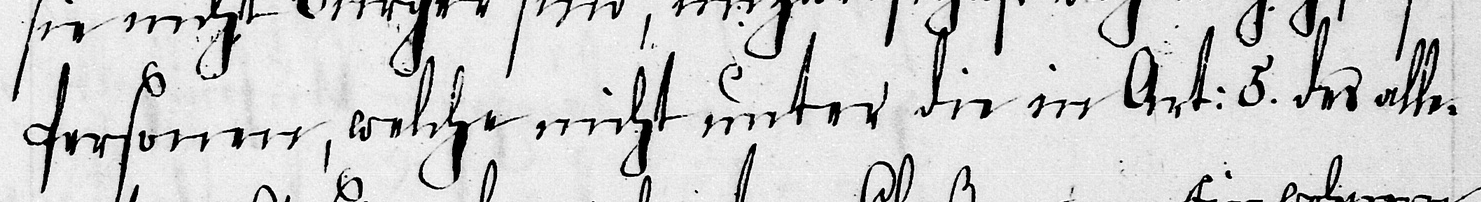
Personen, welche nicht unter die in Art: 5. des all¬
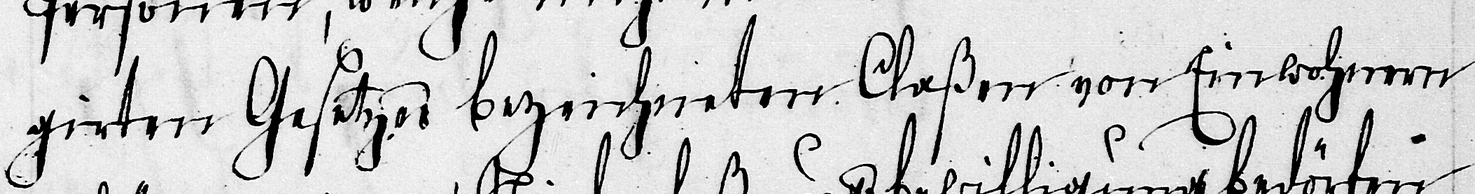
egirten Gesetzes bezeichneten Claßen von Einwohnern
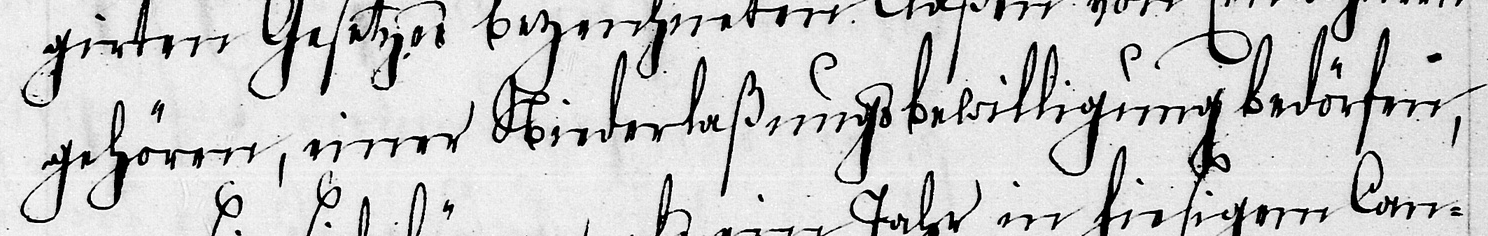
gehören, einer Niederlaßungsbewilligung bedörfen,
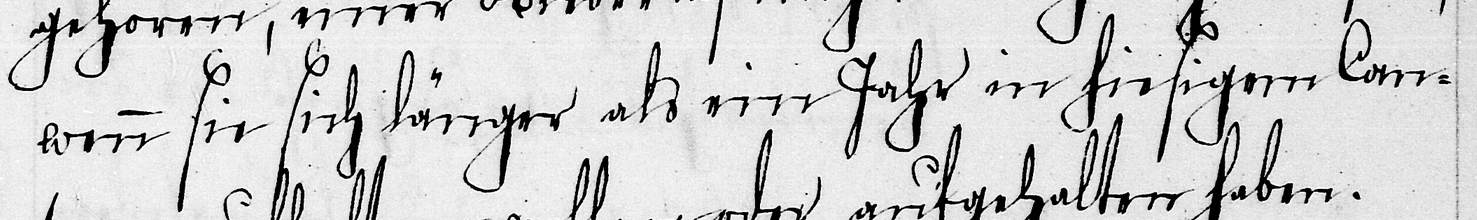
wenn sie sich länger als ein Jahr in hiesigem Can¬
